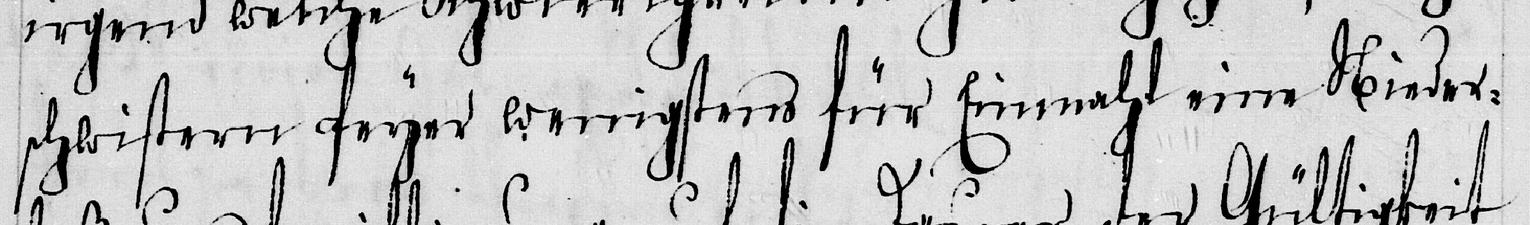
schwistern Peyer wenigstens für Einmahl eine Nieder¬
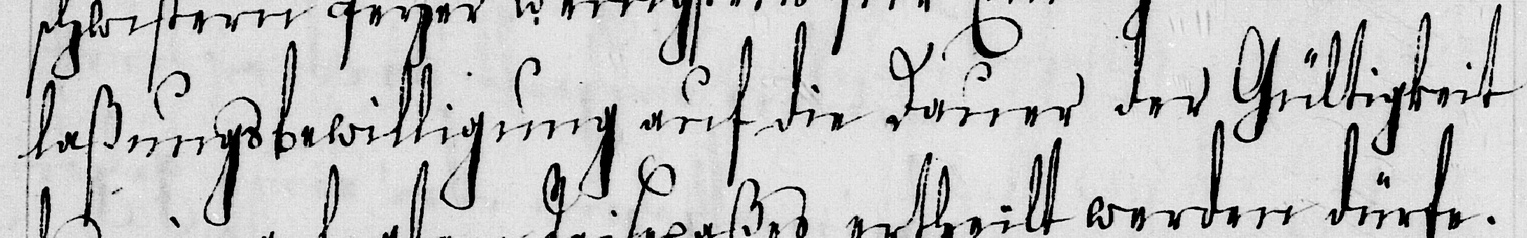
laßungsbewilligung auf die Dauer der Gültigkeit
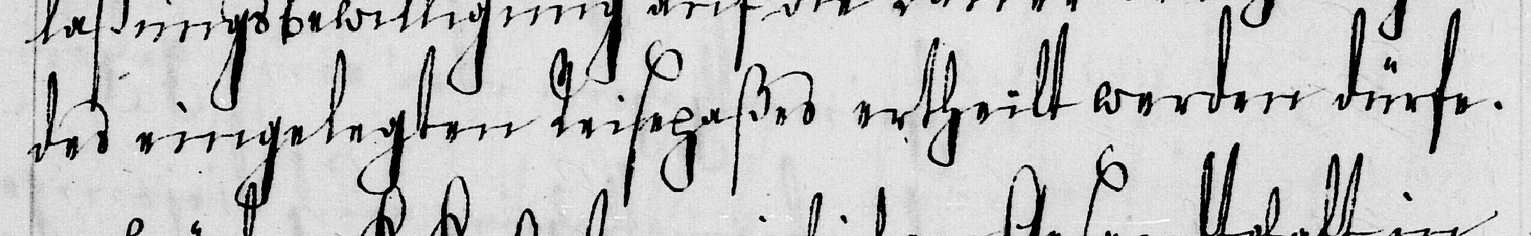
des eingelegten Reisepaßes ertheilt werden dürfe.
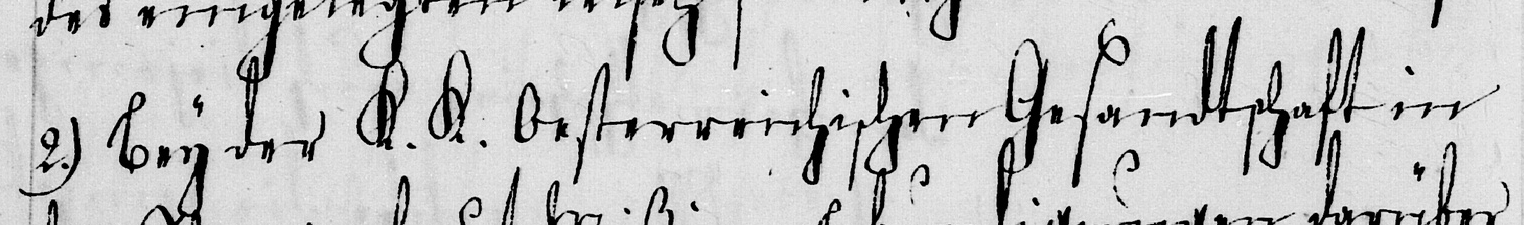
2.) Bey der K. K. Oesterreichischen Gesandtschaft in
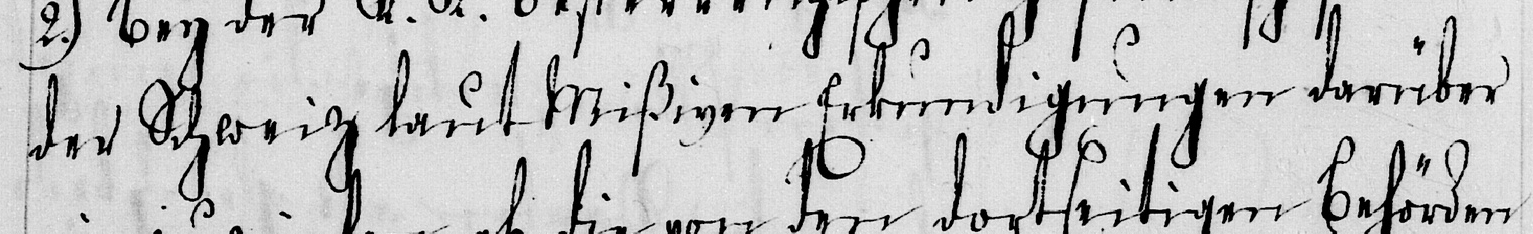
der Schweiz laut Mißiven Erkundigungen darüber
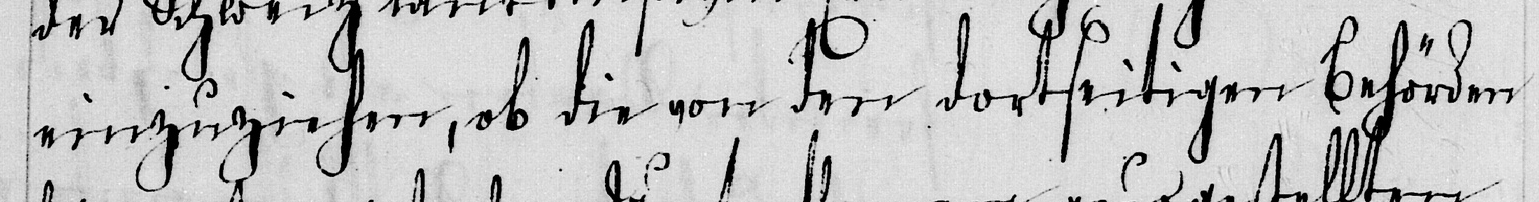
einzuziehen, ob die von den dortseitigen Behörden
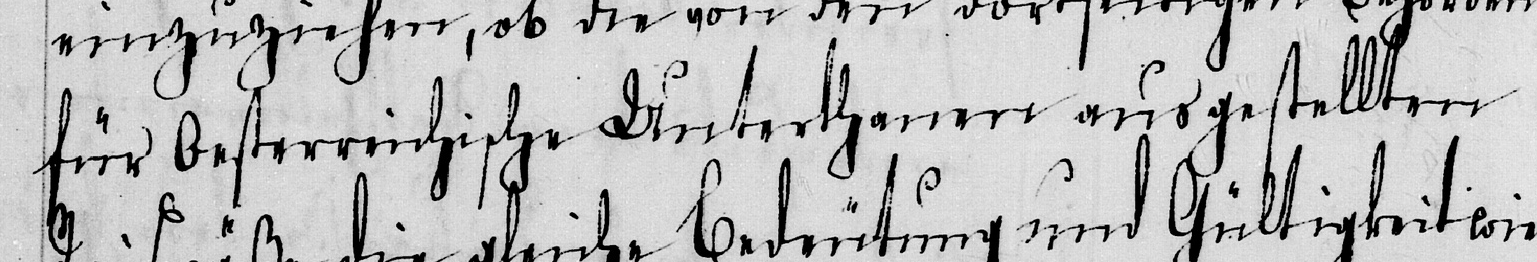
für Oesterreichische Unterthanen ausgestellten
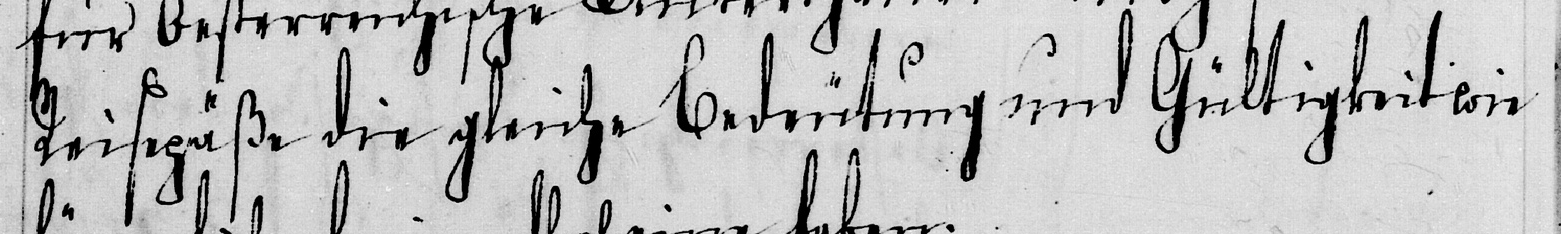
Reisepäße die gleiche Bedeutung und Gültigkeit wie
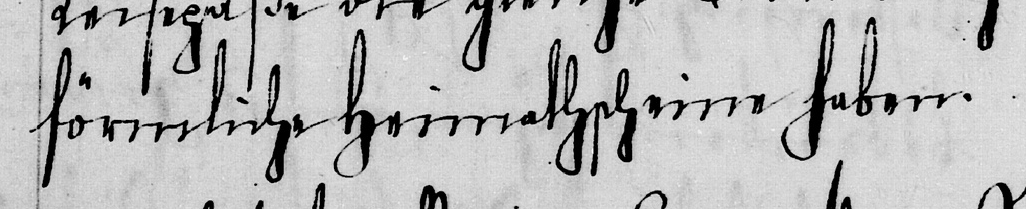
förmliche Heimathscheine haben.
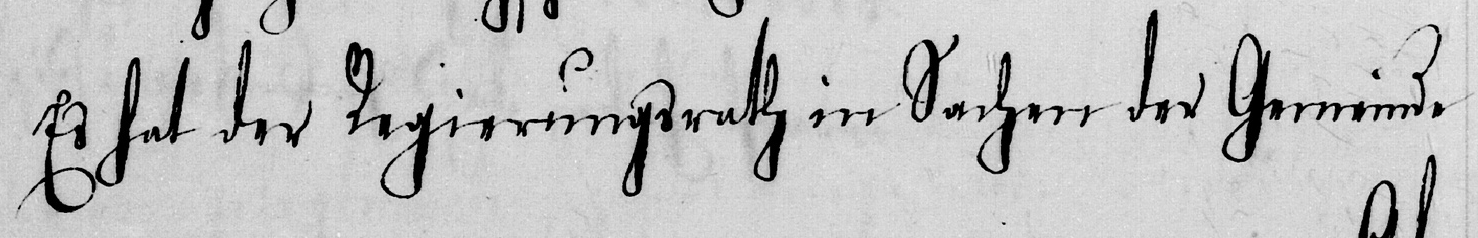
Es hat der Regierungsrath in Sachen der Gemeinde
